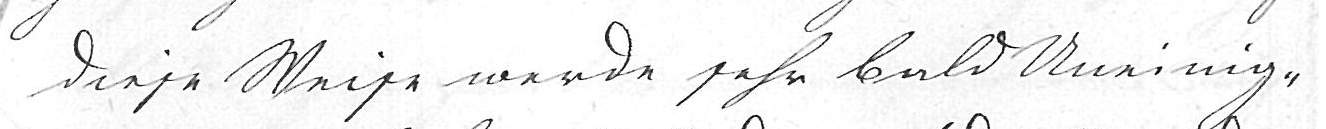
diese Weise werde sehr bald Uneinig-
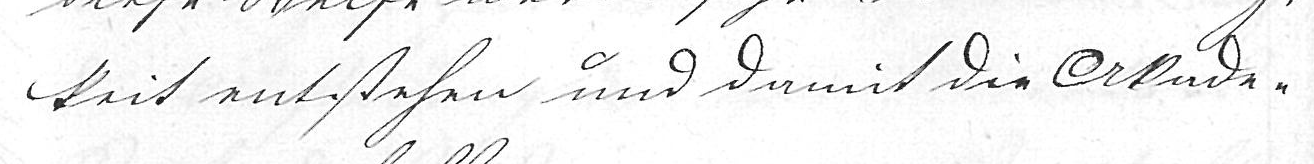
keit entstehen und damit die Akade-
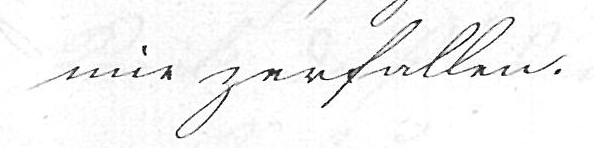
mie zerfallen.
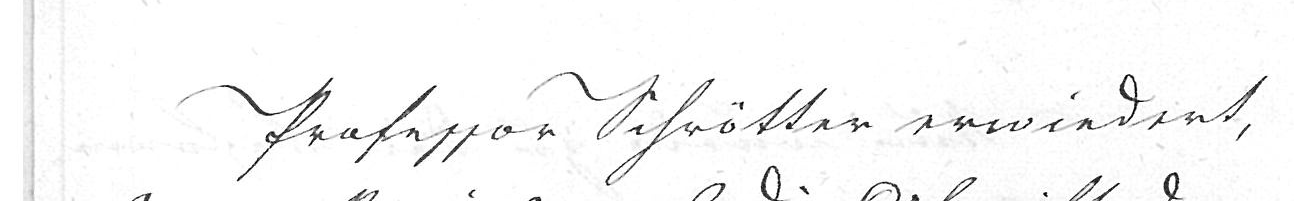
Professor Schrötter erwidert,
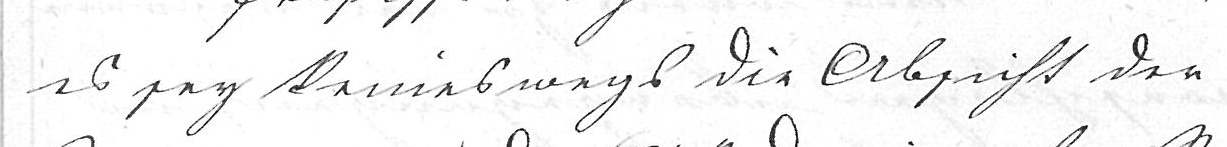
es sey keineswegs die Absicht der
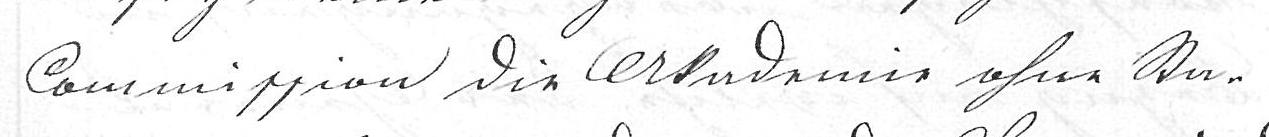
Commission die Akademie ohne Sta-
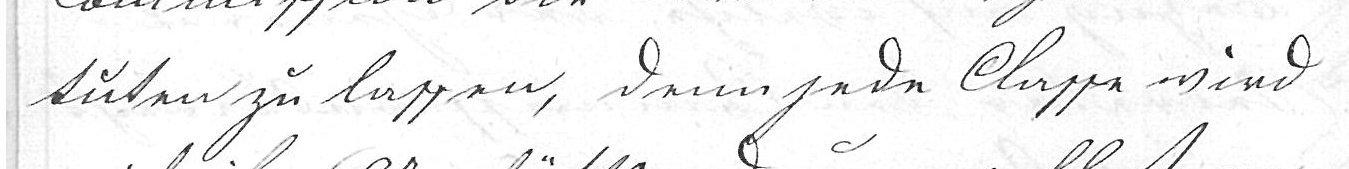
tuten zu lassen, denn jede Classe wird
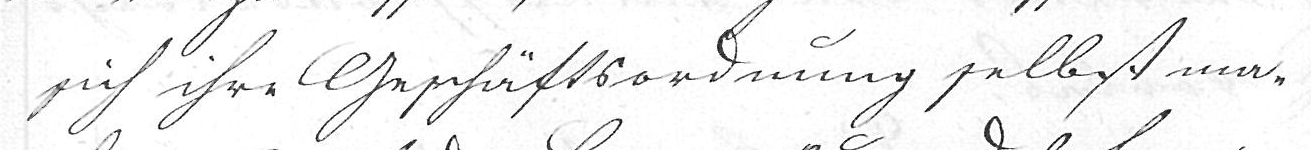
sich ihre Geschäftsordnung selbst ma-
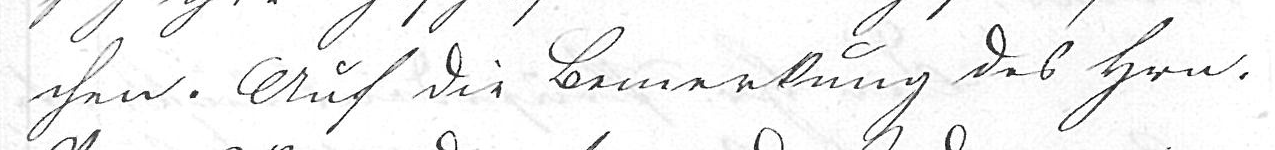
chen. Auf die Bemerkung des Hrn.
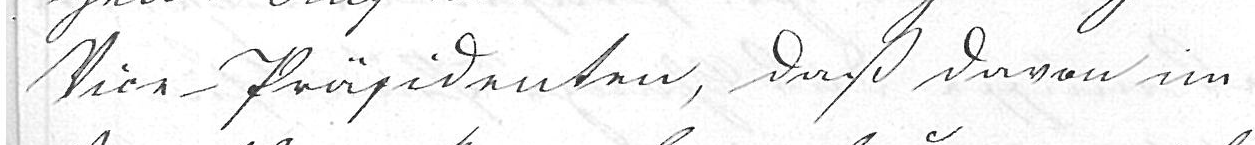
Vice-Präsidenten, daß davon im
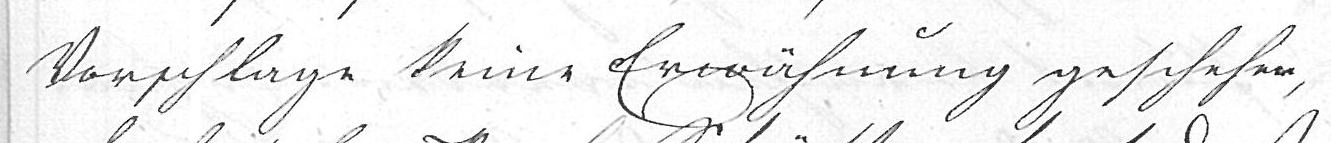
Vorschlage keine Erwähnung geschehen,
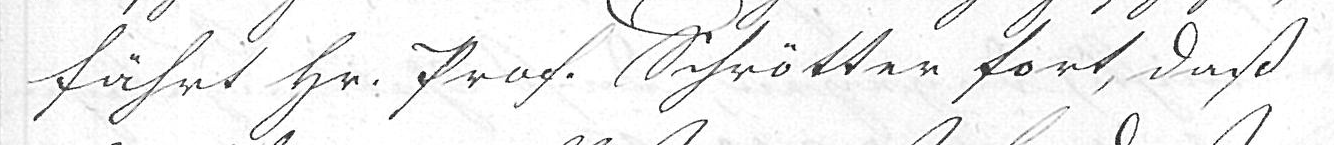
führt Hr. Prof. Schrötter fort, daß
